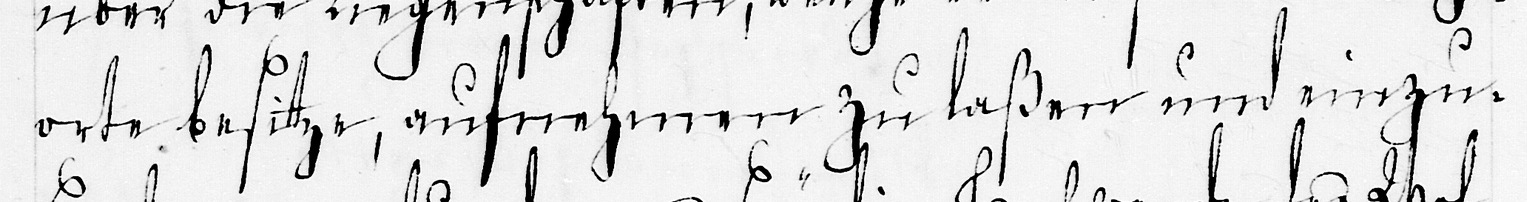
orte besitze, aufnehmen zu laßen und einzu¬
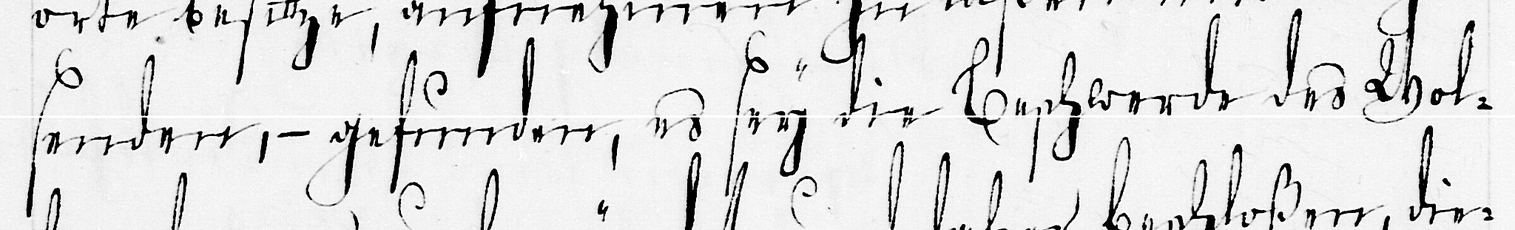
senden, – gefunden, es sey die Beschwerde des Wol¬
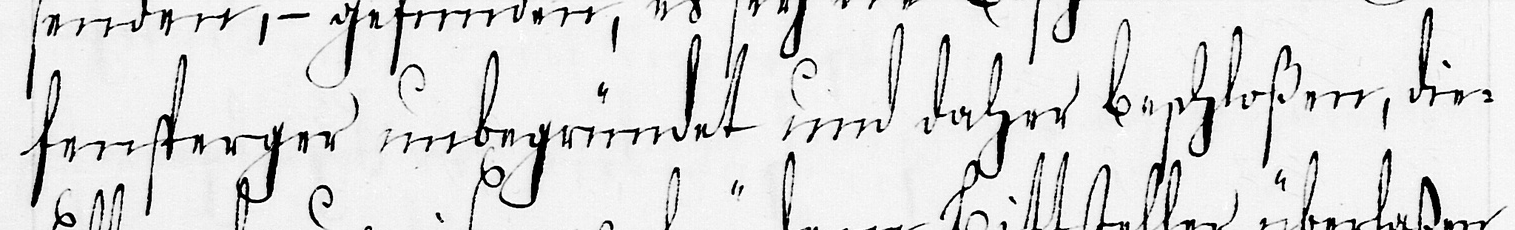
fensperger unbegründet und daher beschloßen, die¬
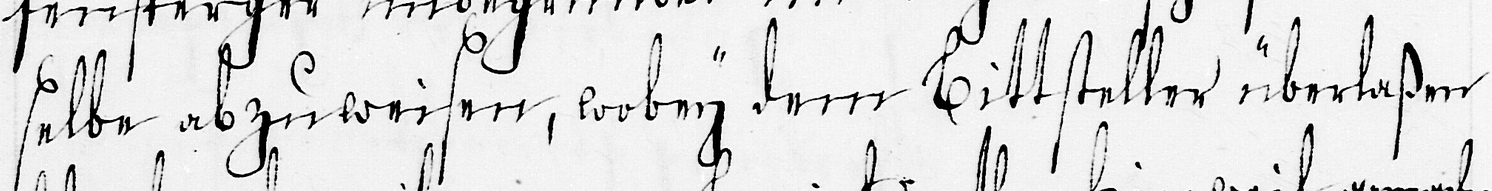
selbe abzuweisen, wobey dem Bittsteller überlaßen
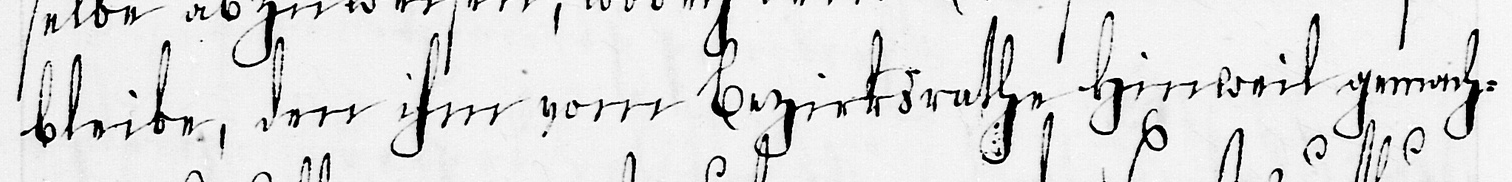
bleibe, den ihm vom Bezirksrathe Hinweil gemach¬
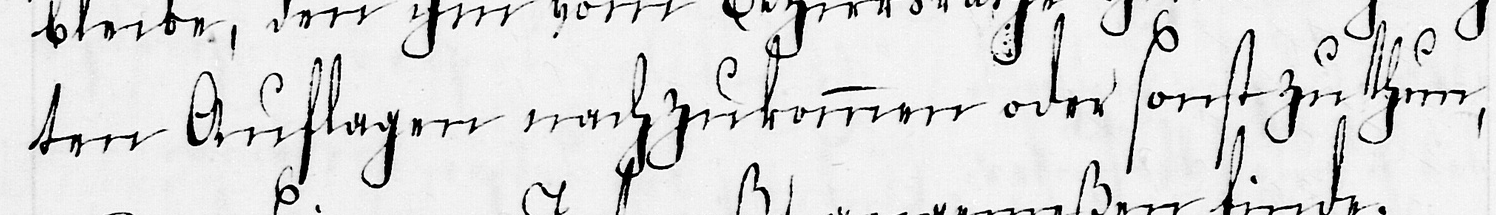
ten Auflagen nachzukommen oder sonst zu thun,
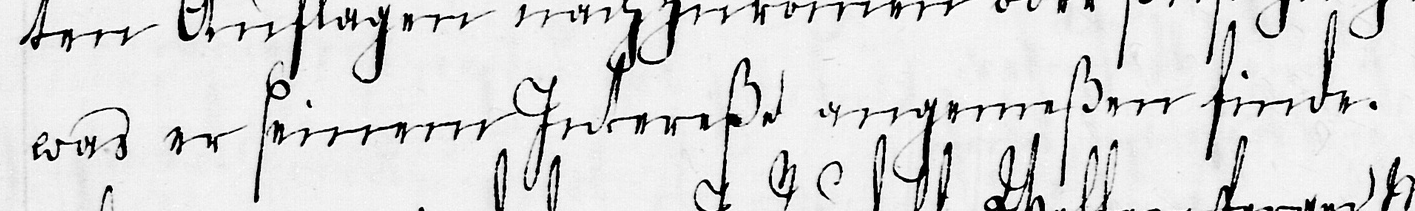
was er seinem Intereße angemeßen finde.
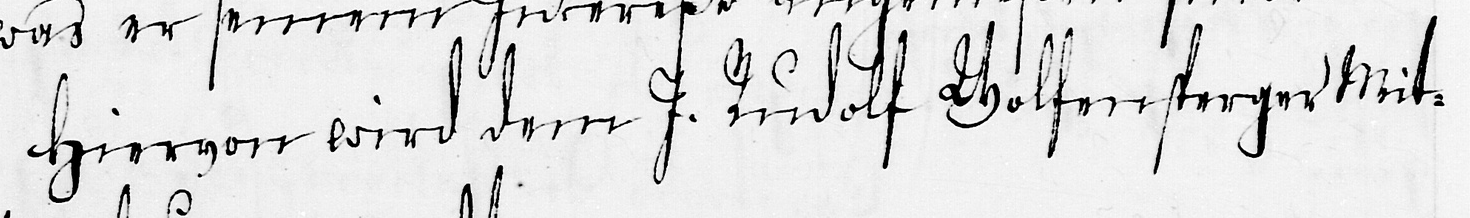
Hiervon wird dem J. Rudolf Wolfensperger Mit¬
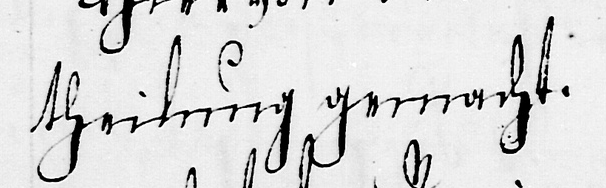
theilung gemacht.
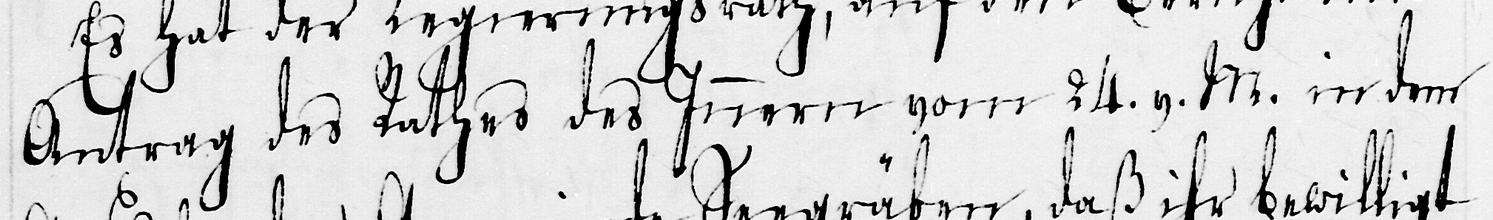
Antrag des Rathes des Innern vom 24. v. M. in dem
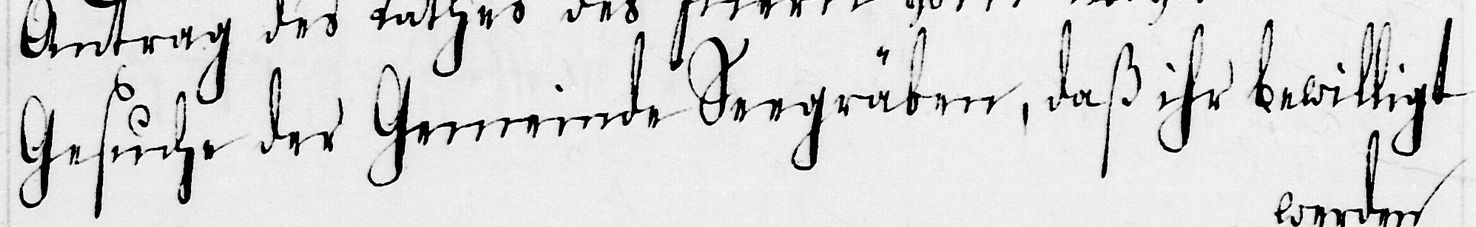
Gesuche der Gemeinde Seegräben, daß ihr bewilligt
